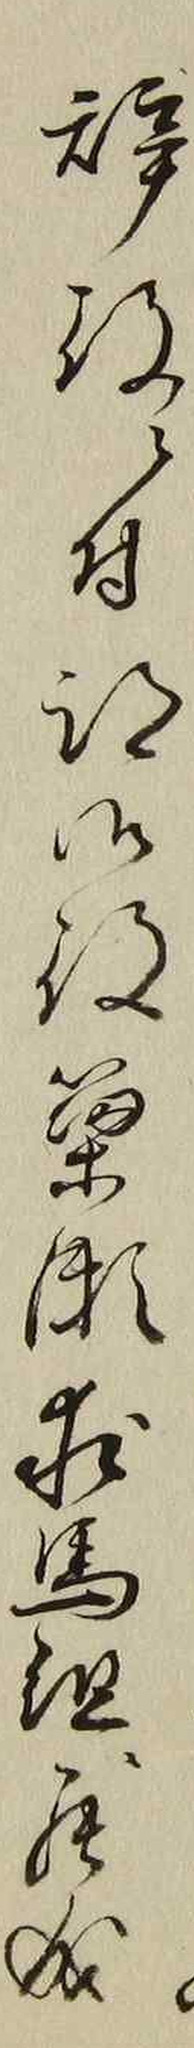辞役に付後御役築瀬求馬組に罷成
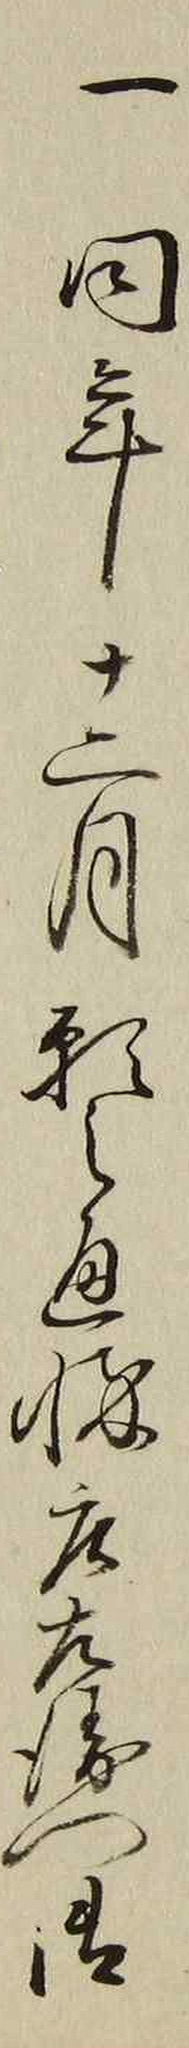一同年十二月願の通倅庄左衛門御
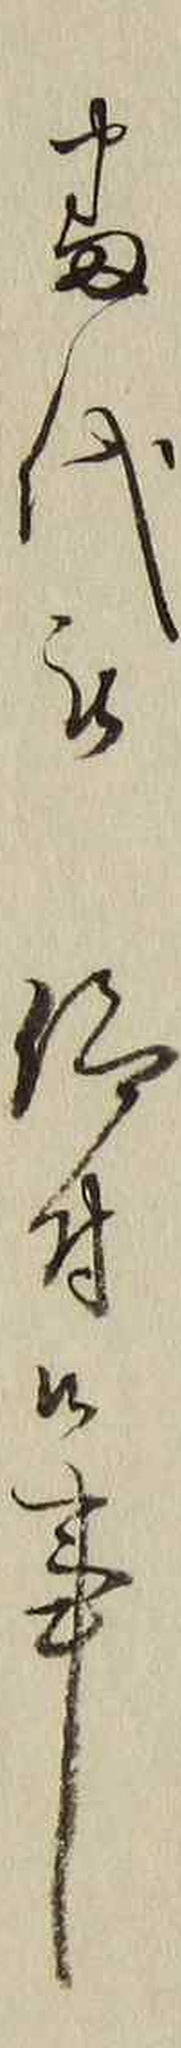番代被仰付候事
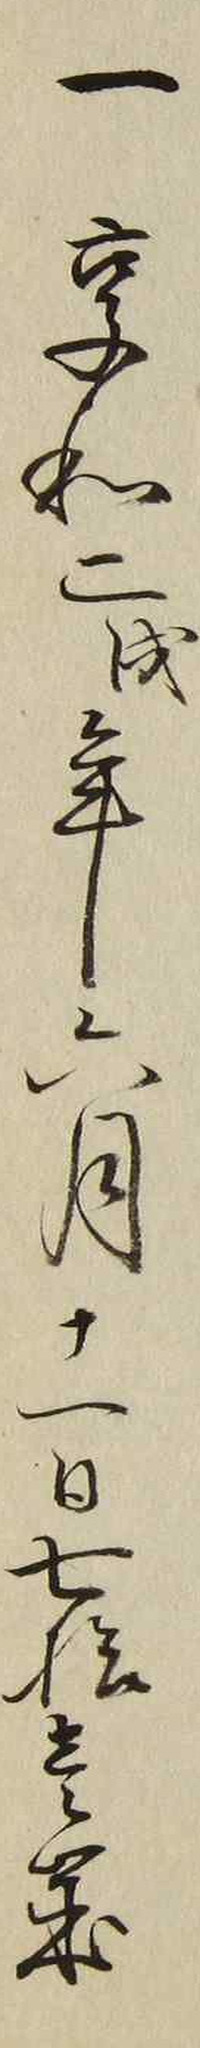一享和二戌年六月十一日七拾壱歳

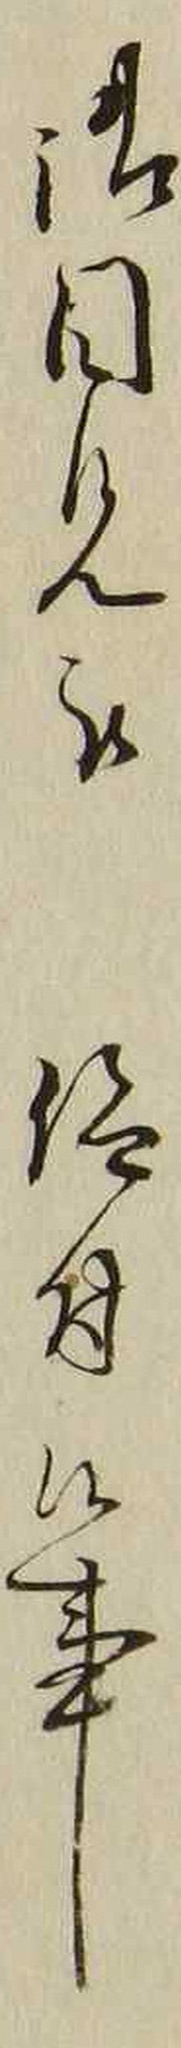御目見被仰付候事
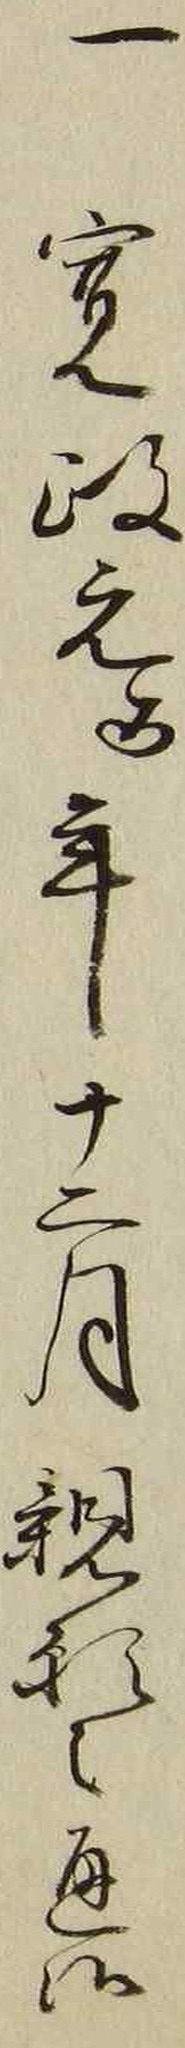一寛政元酉年十二月親願の通御
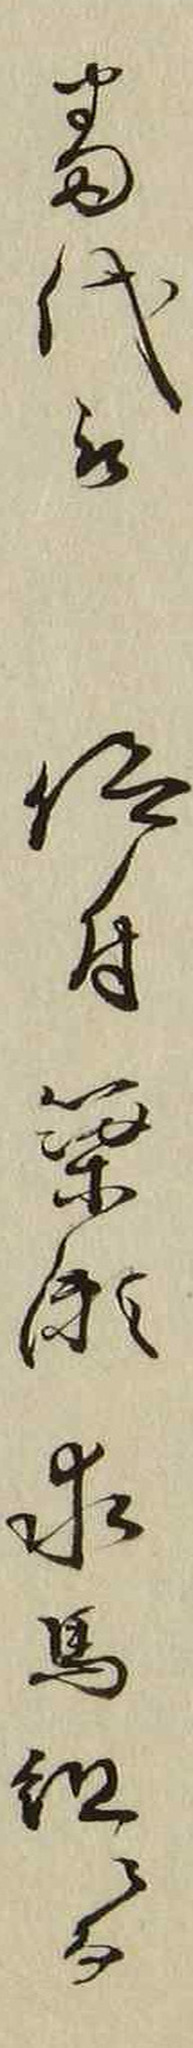番代被仰付簗瀬求馬組に而
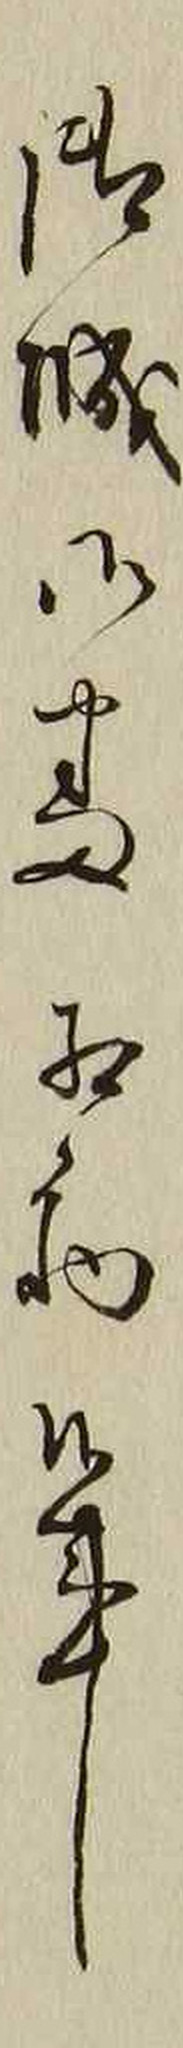御城御番相勤候事
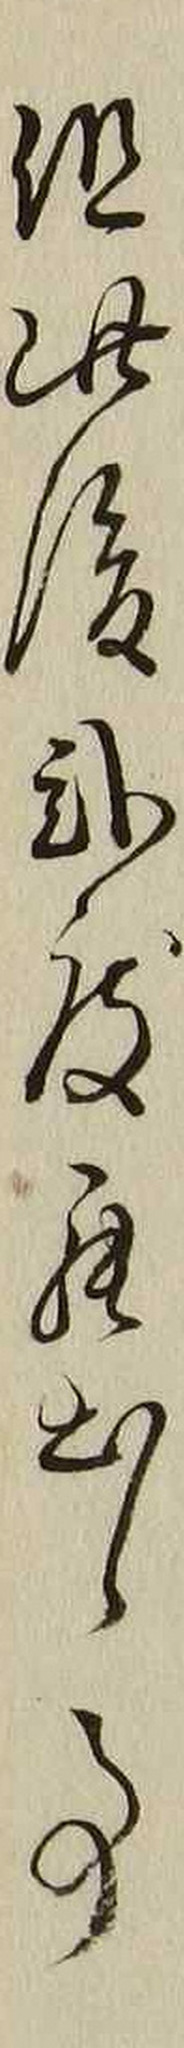但此度弐度罷出候事
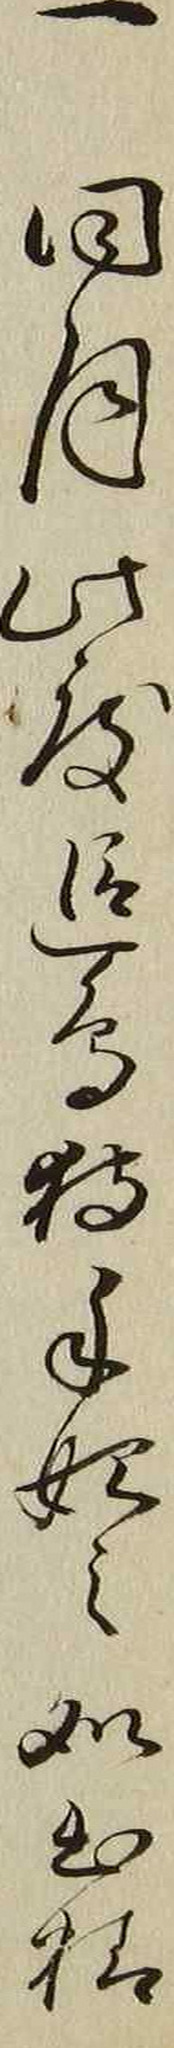一同月此度追鳥狩手始の処出精
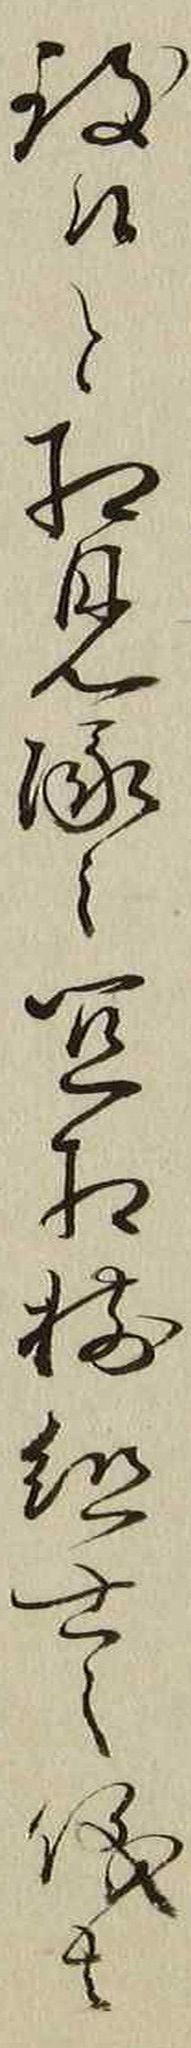致候と相見隊の宜相揃組士之儀は
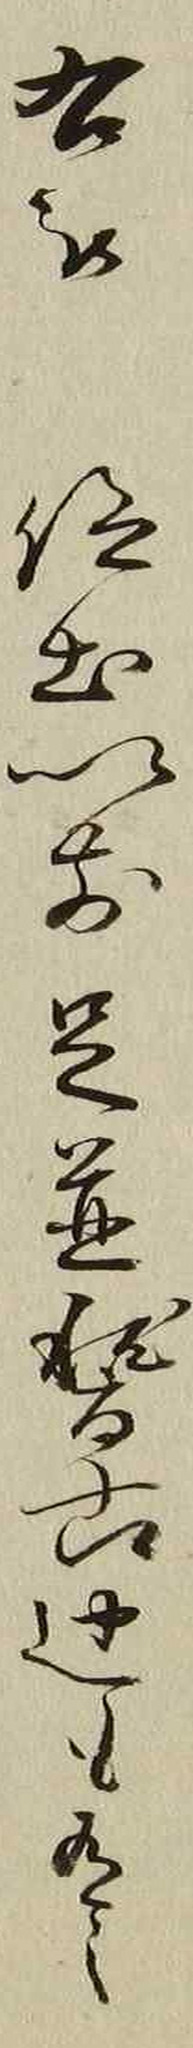右被仰出以前足並稽古迚も有之
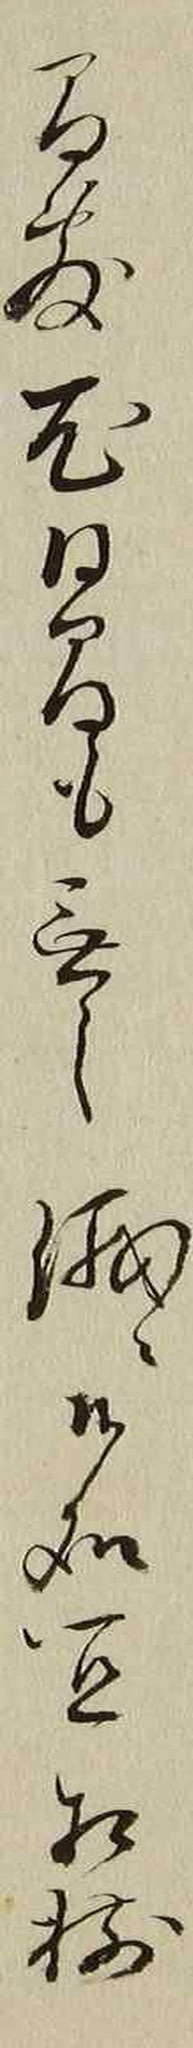間敷尤日間も無之俄に候処宜相揃
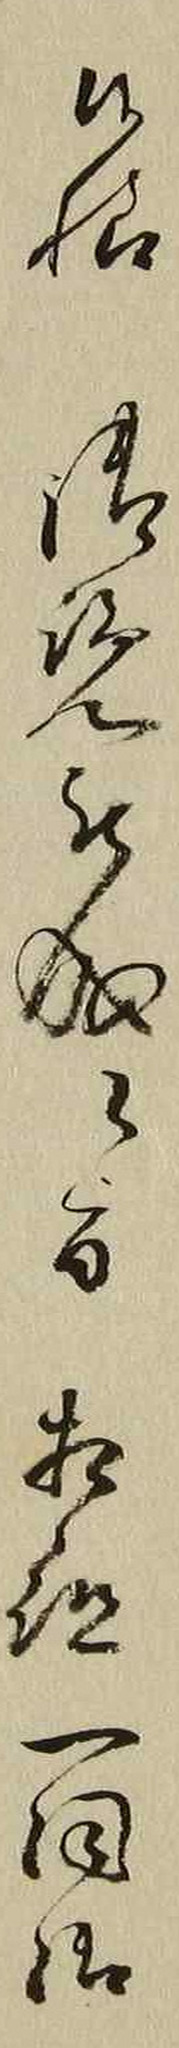候様御覧被成候旨相組一同御
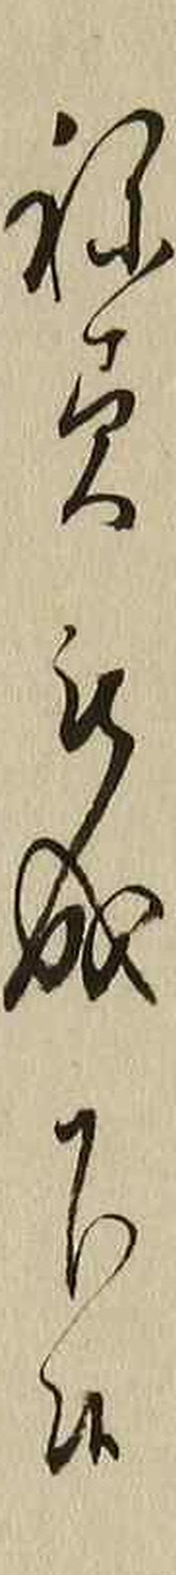称美被成下候
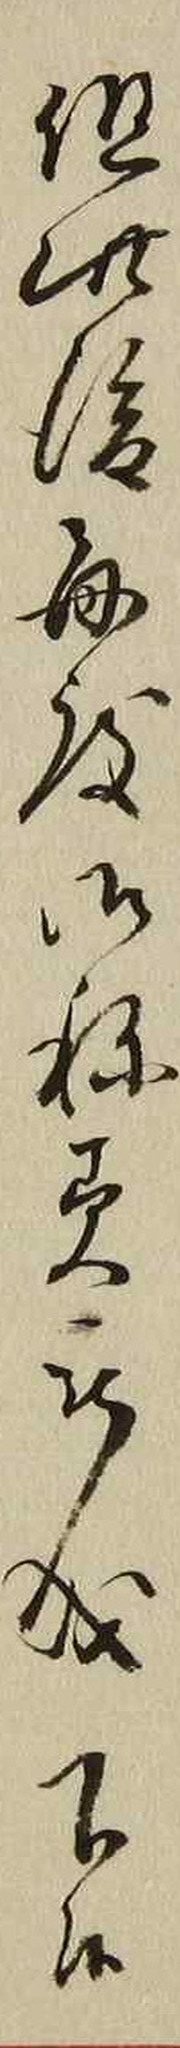但此後毎度御称美被成下候
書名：諸士系譜　巻之1　い之部1
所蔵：会津若松市立会津図書館
